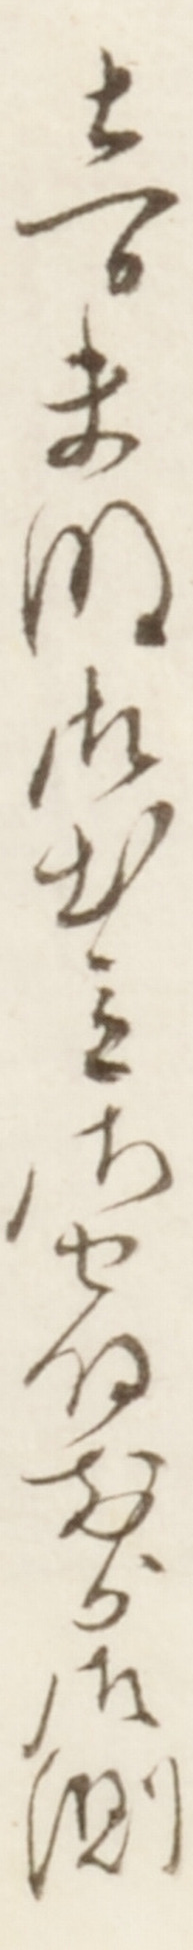十二日未明御出立御宿前より御測
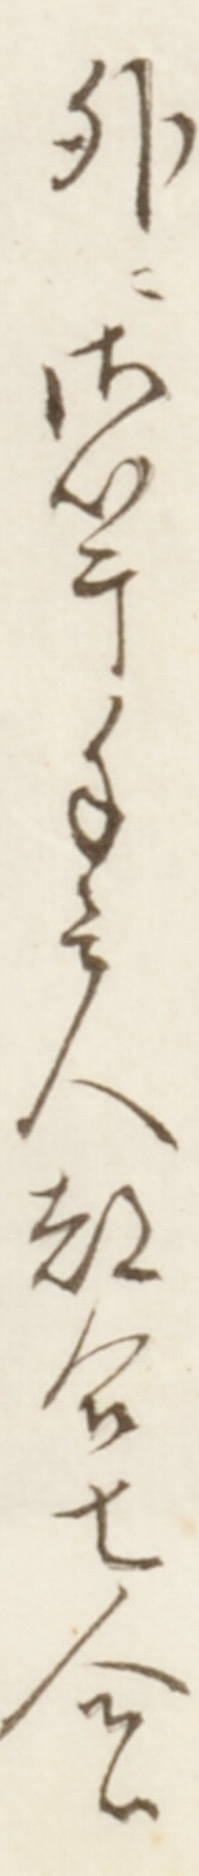外ニ御竿手壱人都合七人者
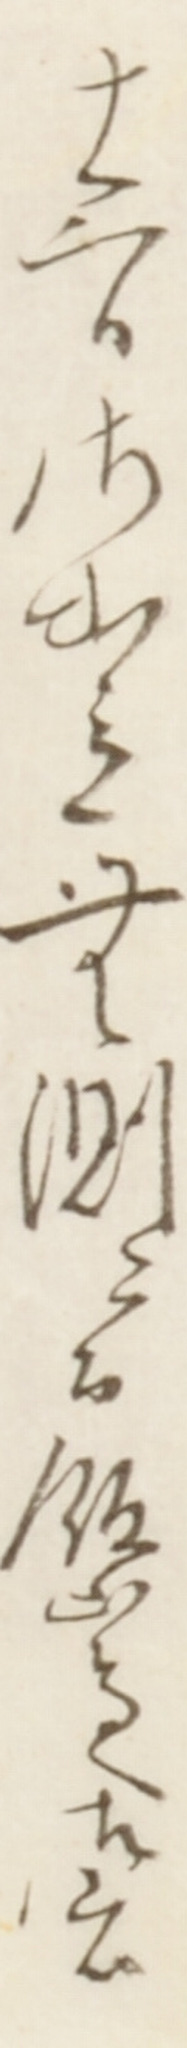十三日御出立無測ニ而飯嶋へ相着

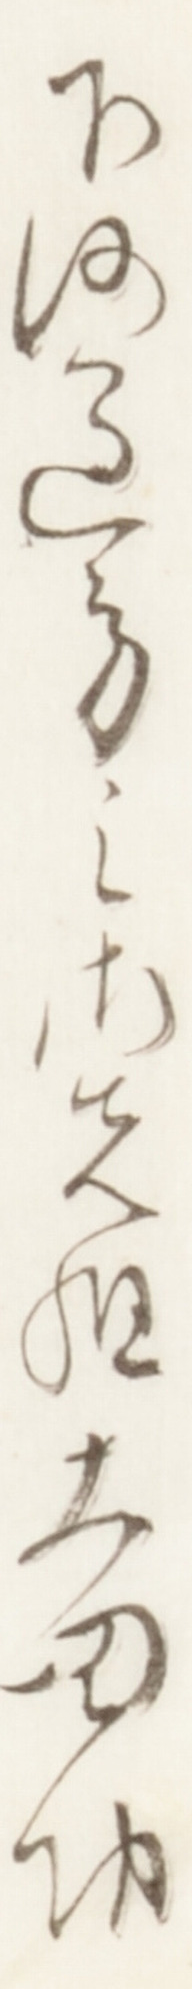下河辺方之御先組大田切
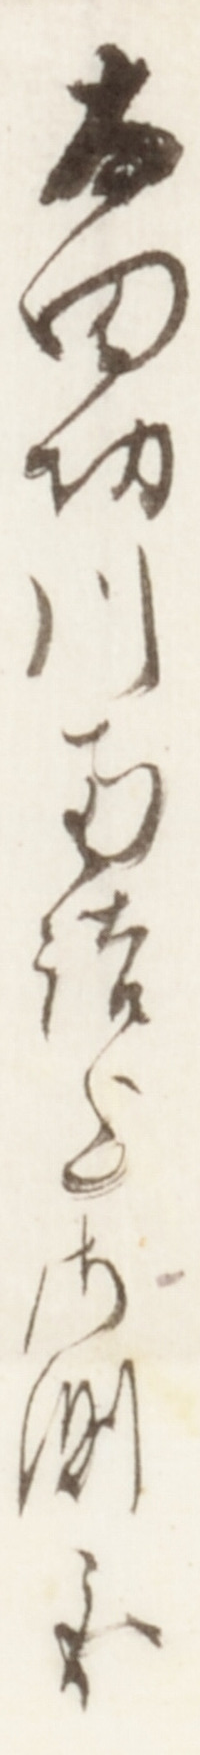大田切川南詰迄御測被成
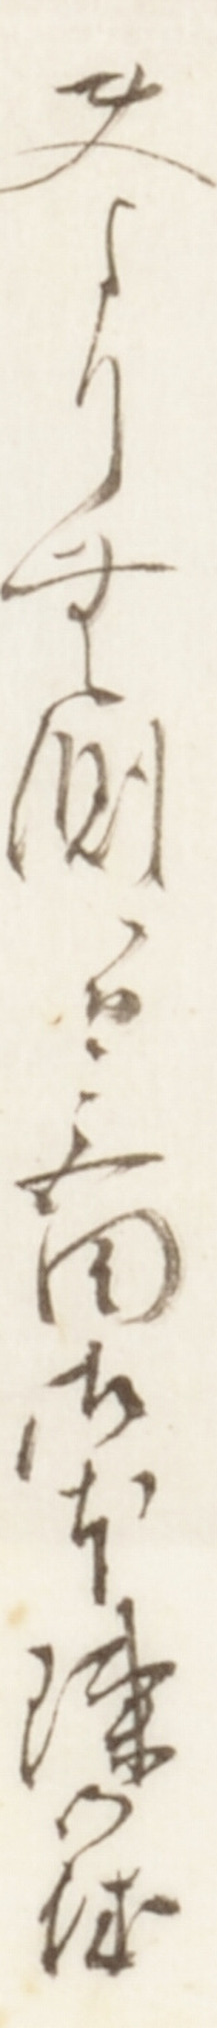夫より無測ニ而宮田御本陣御休
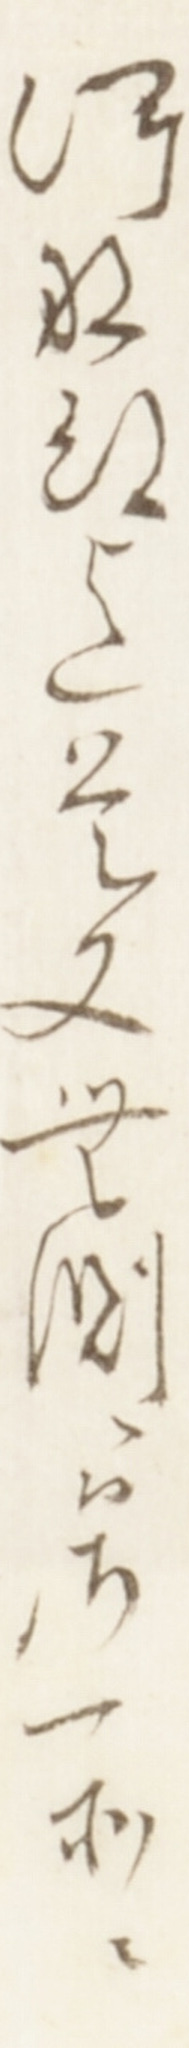伊那部迄是又無測ニ而御一所ニ
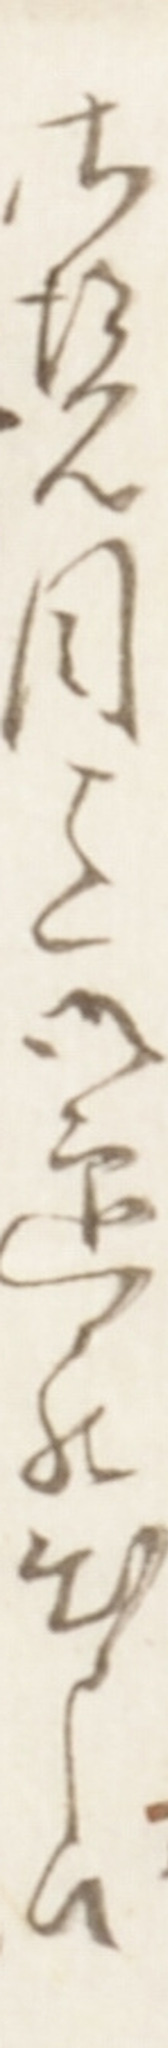御境目迄御迎罷出申候
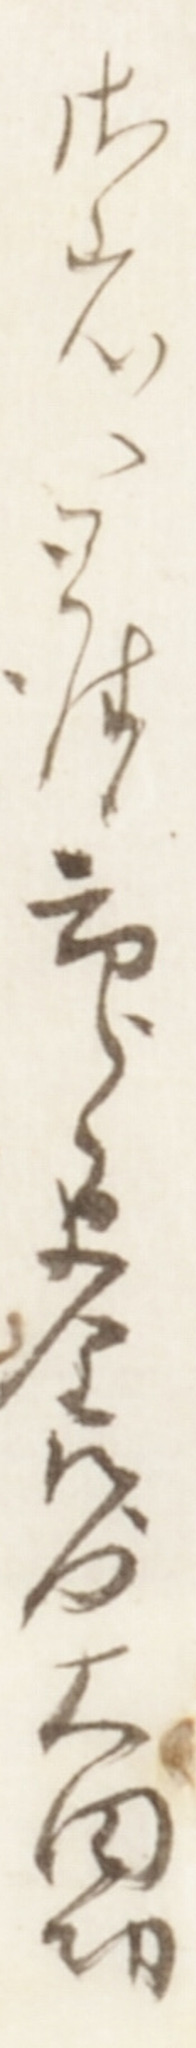御着ニ御座候市郎兵衛金左衛門大田切
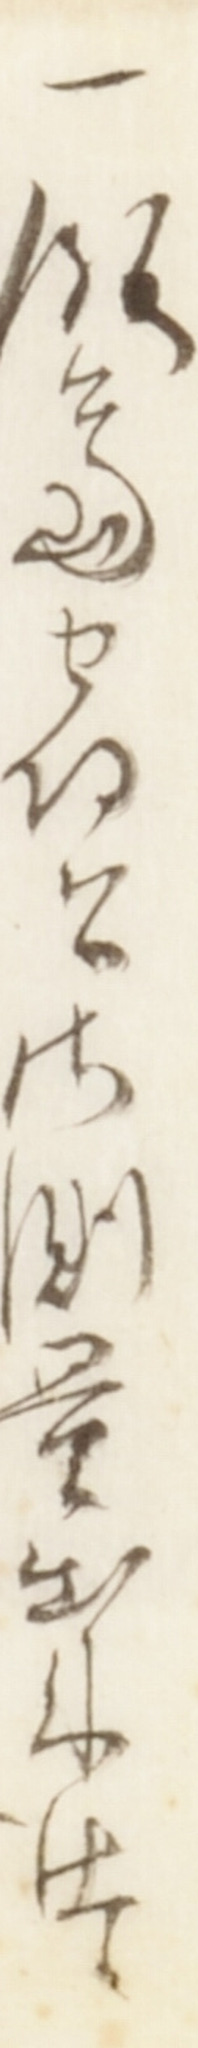一飯嶋宿者御測量出来仕候
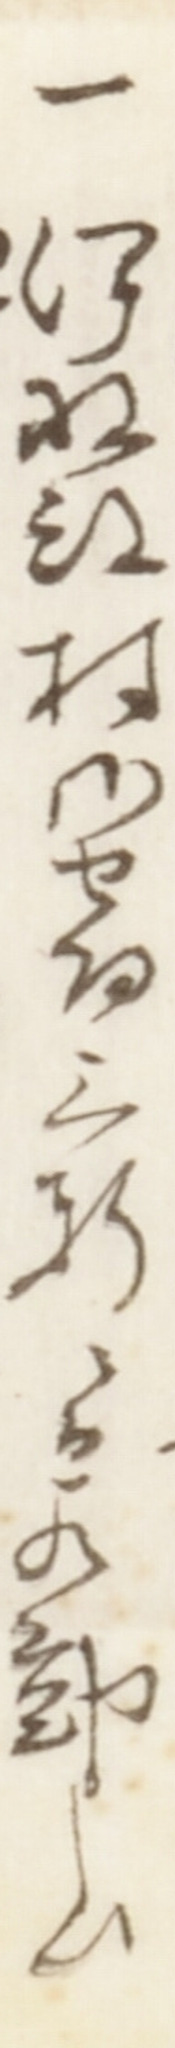一伊那部村御宿三軒ニ而相勤申候
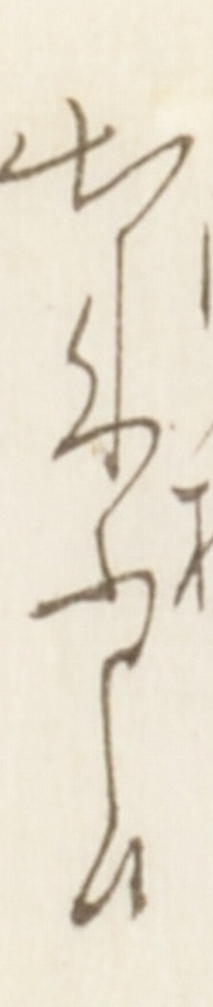出来不申候
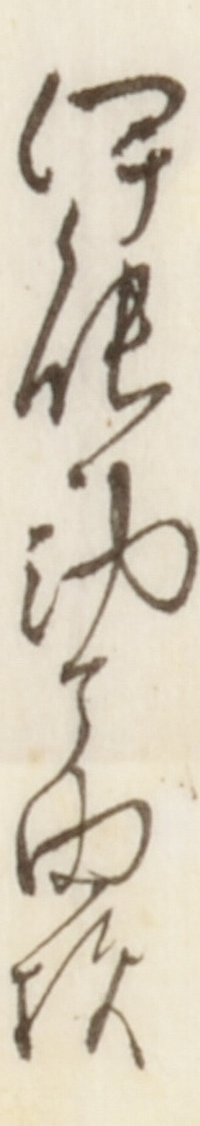伊能勘ケ由様
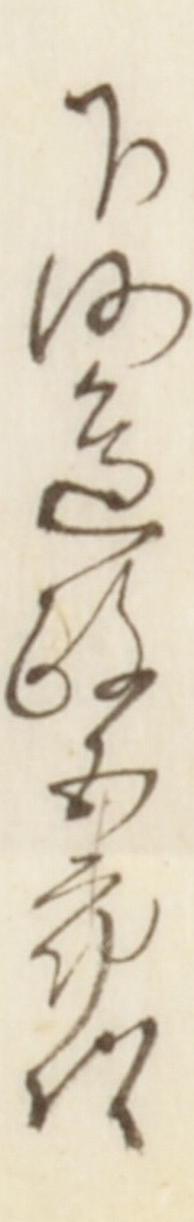下河邊政五郎様
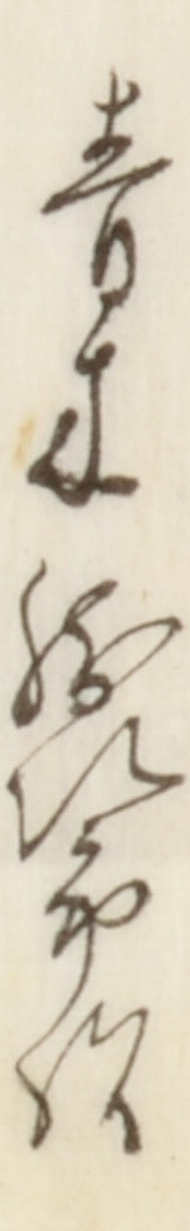青木勝次郎様
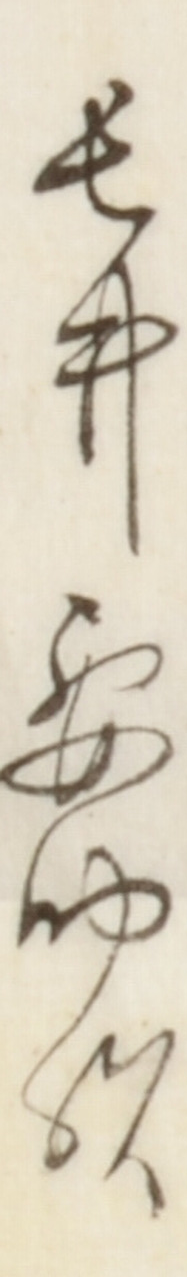長井要助様
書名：御測量諸事控
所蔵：伊那市立高遠町図書館・合同会社AMANE
